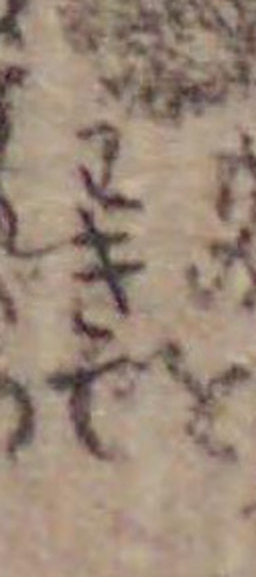わきで
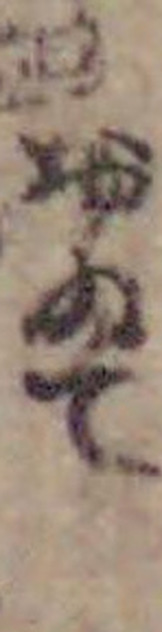おゐて
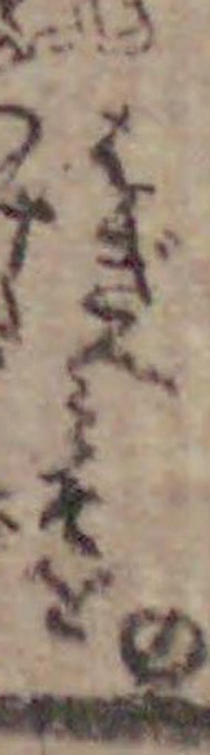はぎへみそを
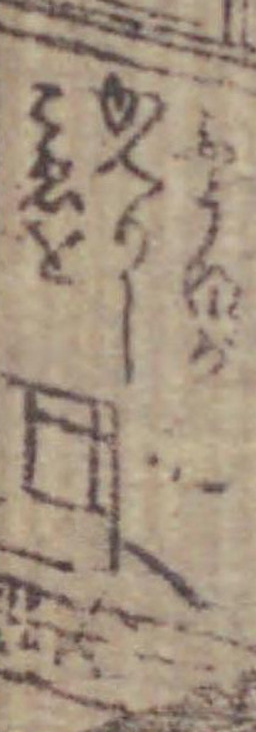かへりし
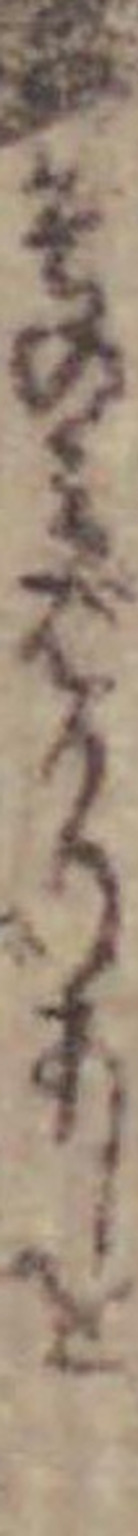そのみばかりあしを
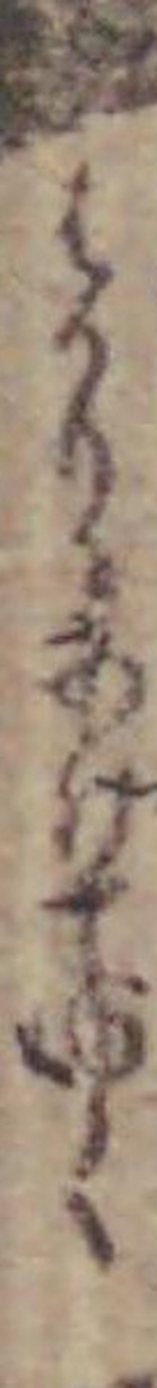はかりににげてゆく
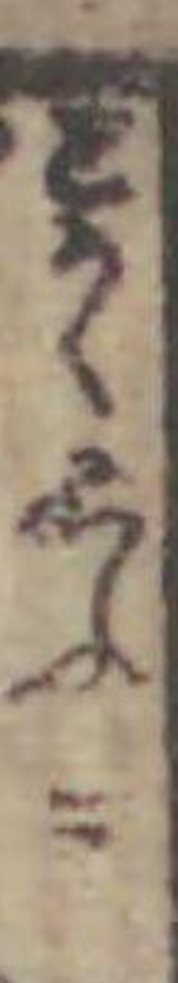とかく思ふ
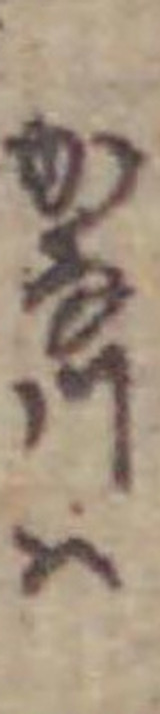かな川は
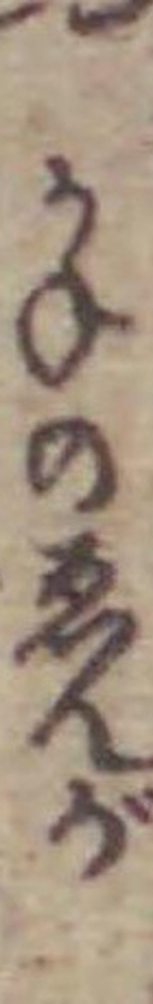かねのゑんが
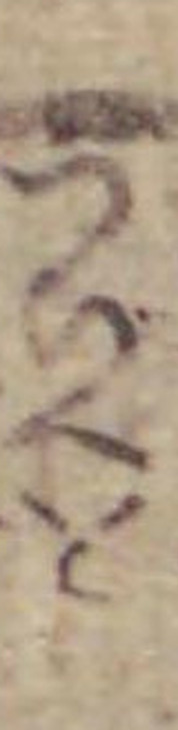ついへを
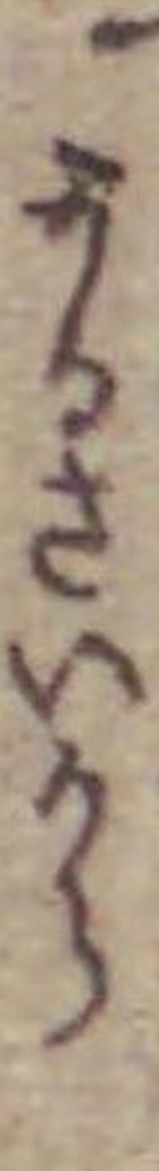うるさいから
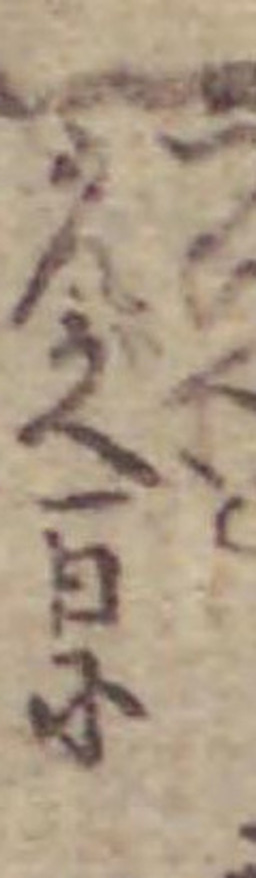かんがへ一日に
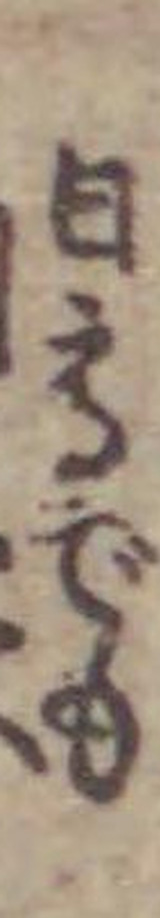日高でも
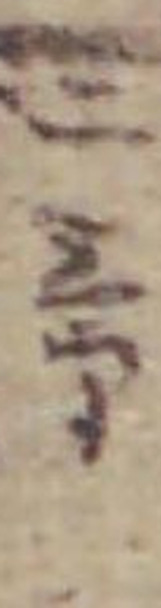二三里
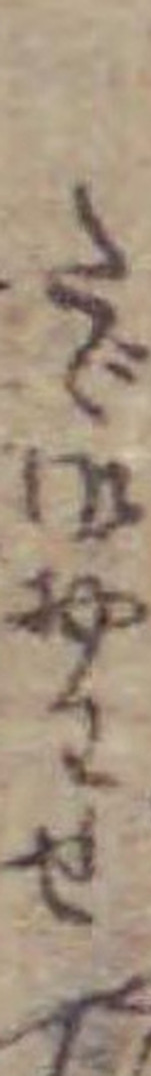たゞ御おわせ
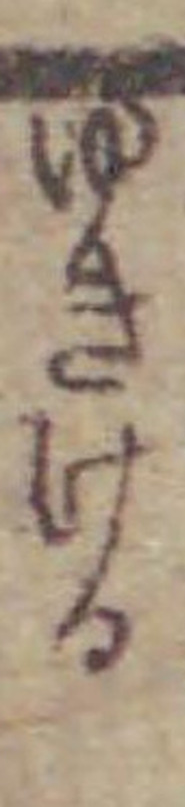ゆきける
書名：莫切自根金生木 : 3巻
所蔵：国立国会図書館 National Diet Library, JAPAN
